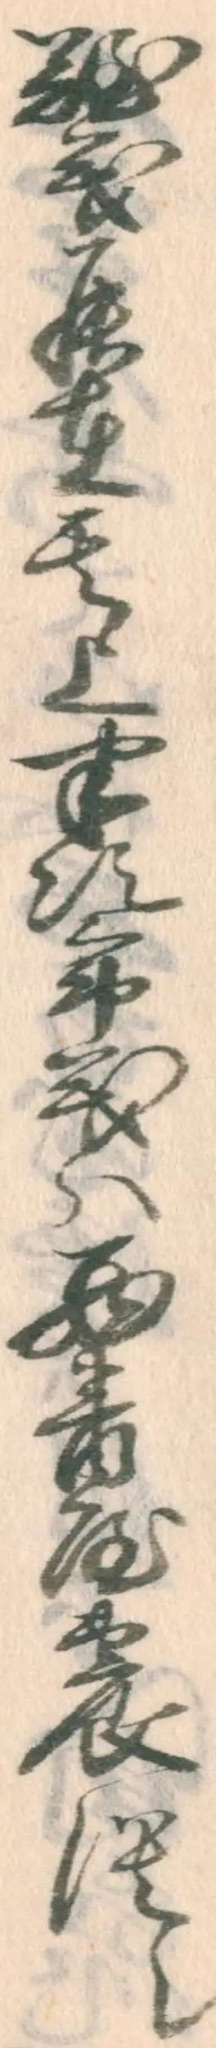難義罷在其上半次郎義ハ西番屋震潰レ
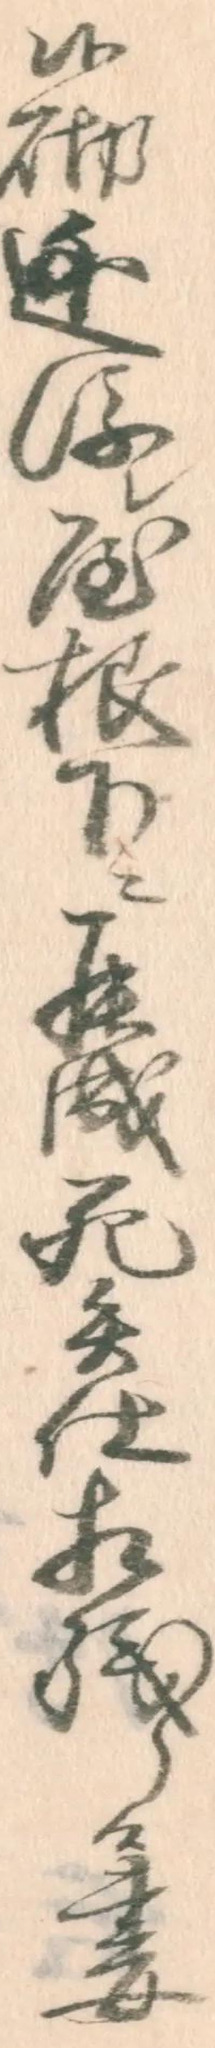候砌逃後レ屋根下ニ罷成死失仕相残り候妻
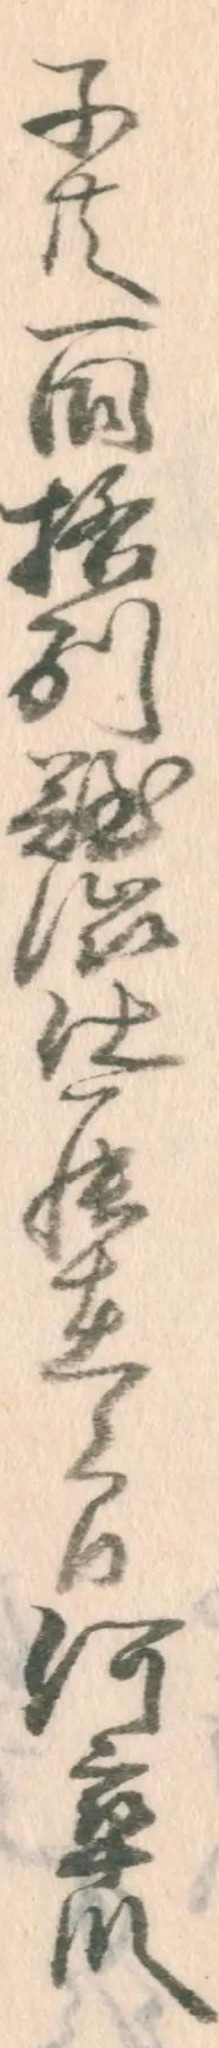子共一同格別難渋仕罷在候間何卒以
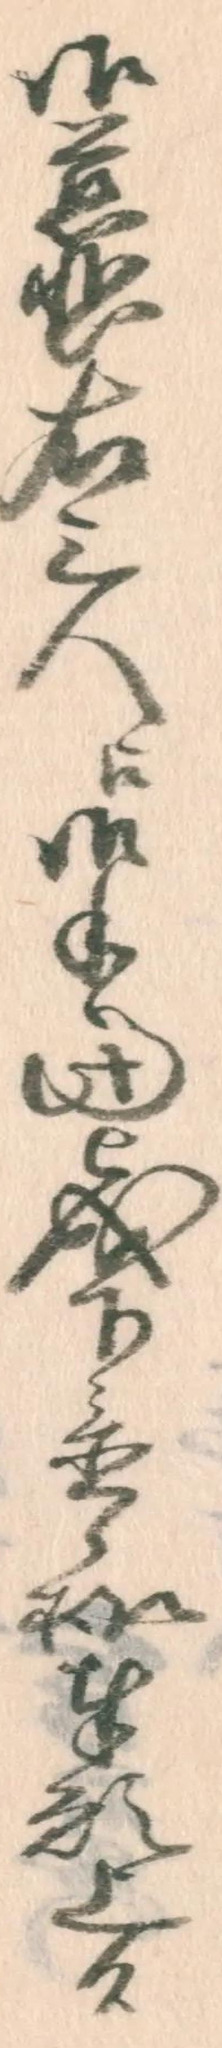御慈悲右三人江御手当被成下置候様奉願上候
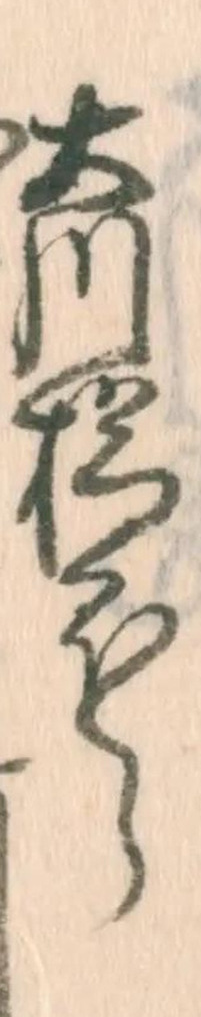大川橋懸り
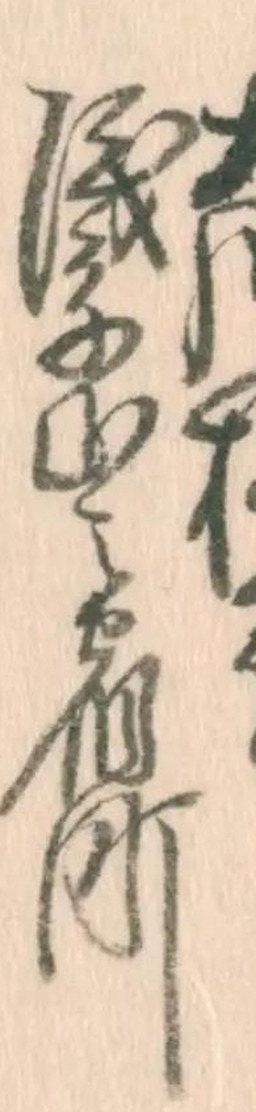浅草山之宿町
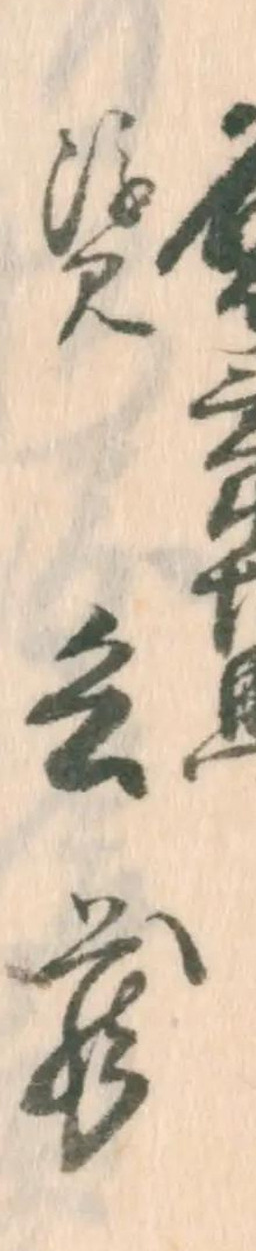後見兵蔵
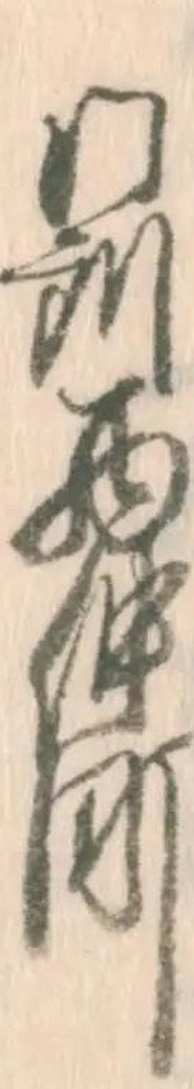同所西仲町
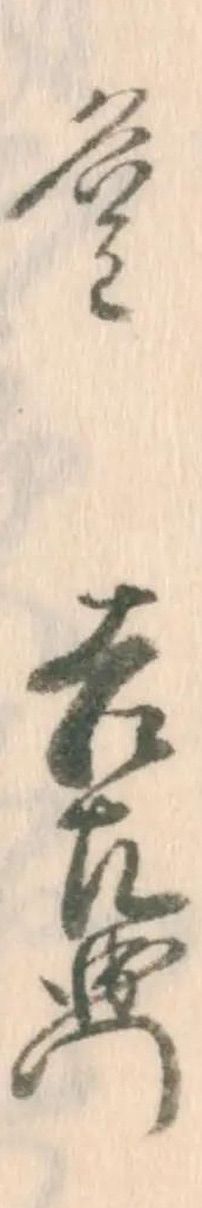名主吉左衛門
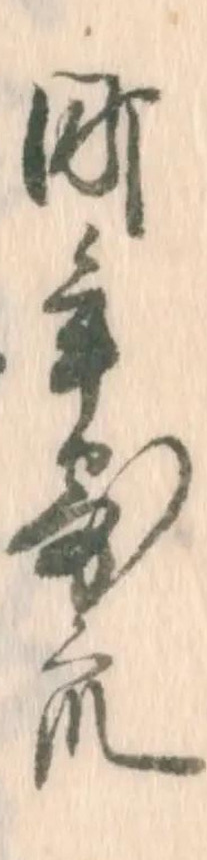町年寄衆
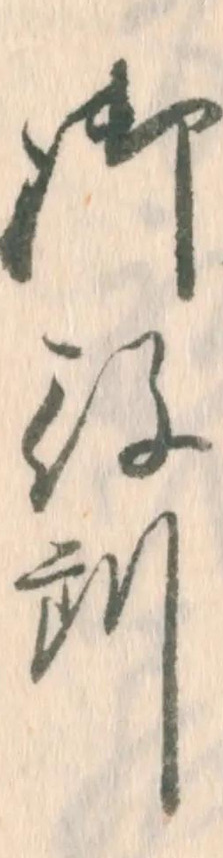御役所
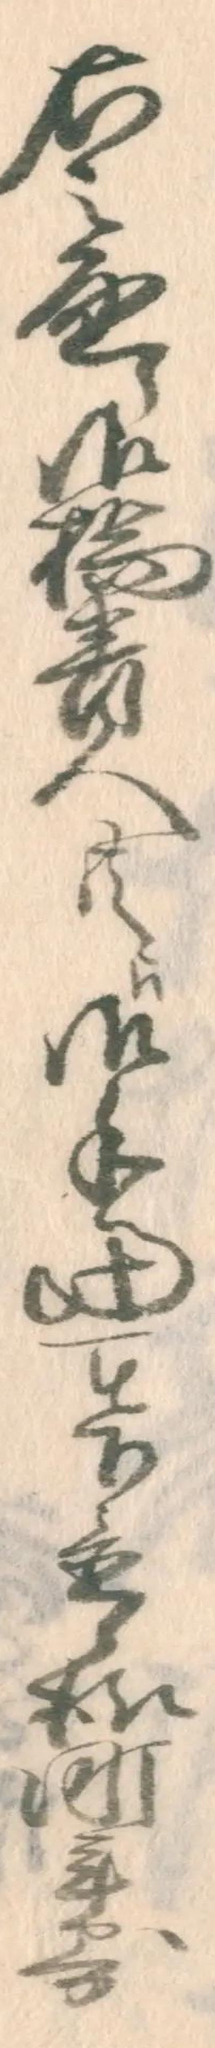右之通り御橋番人共え御手当被下置候様町年寄
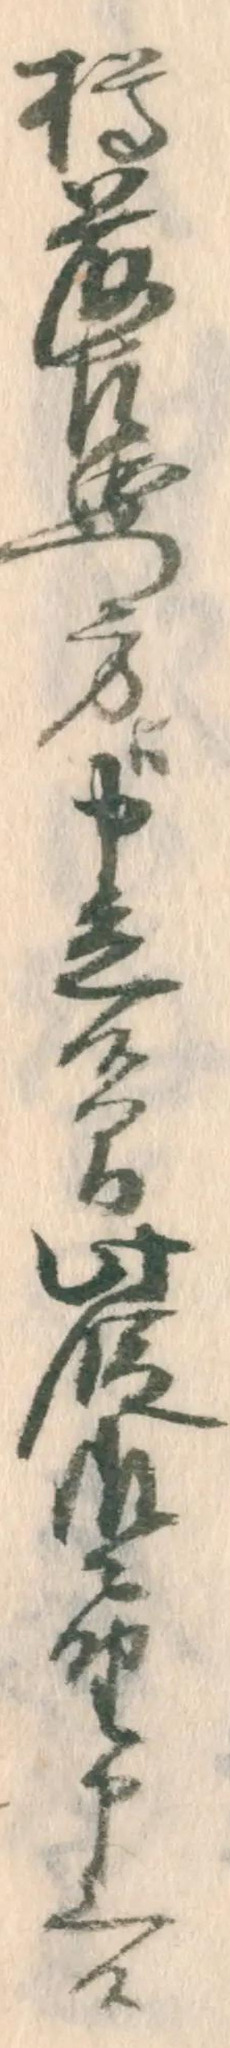樽藤左衛門方え申立候間此段御届申上候

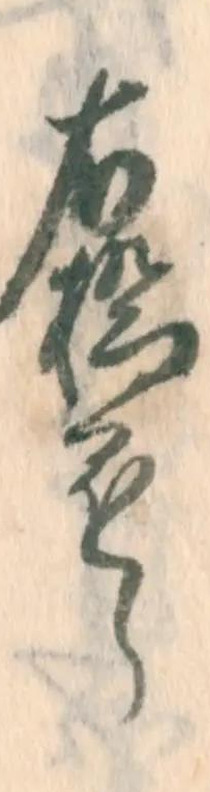右橋懸り
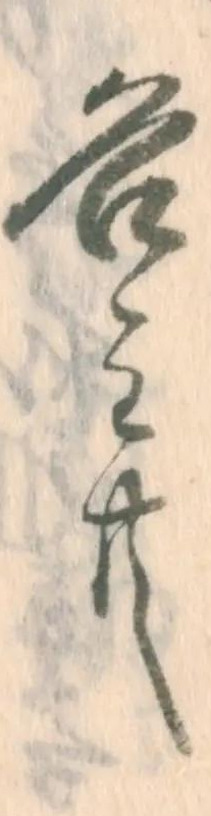名主共
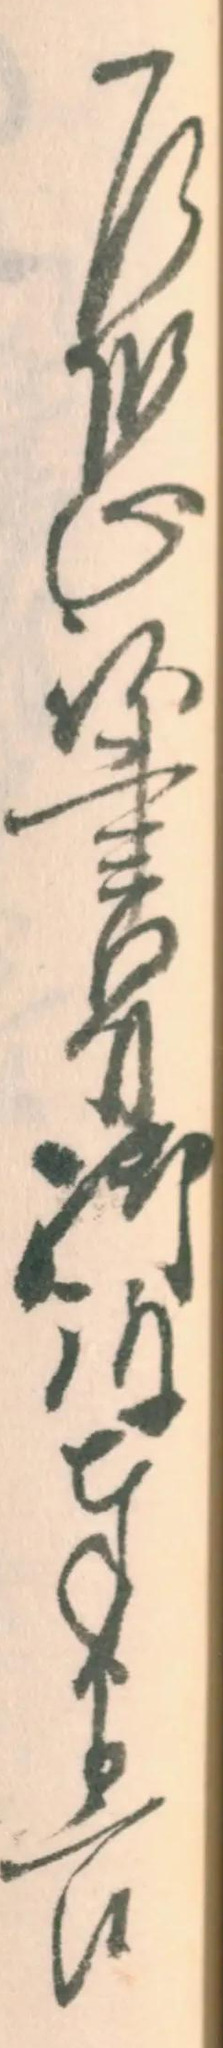乍恐以書付御訴奉申上候
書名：地震災書留 2巻. [1] 内表紙に「地震災書留　安政二卯年　但本所深川御用屋敷地代免除調」とあり
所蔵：国立国会図書館 National Diet Library, JAPAN
